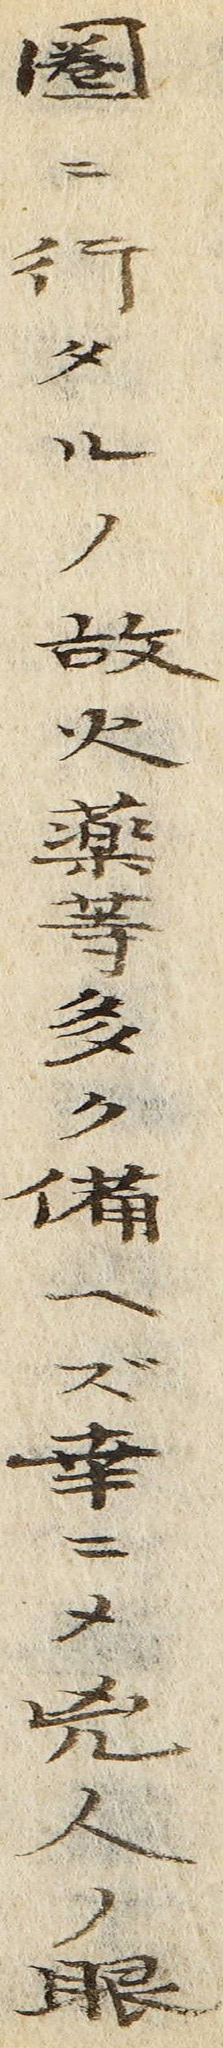圏ニ行タルノ故火薬等多ク備ヘズ幸ニシテ兇人ノ眼
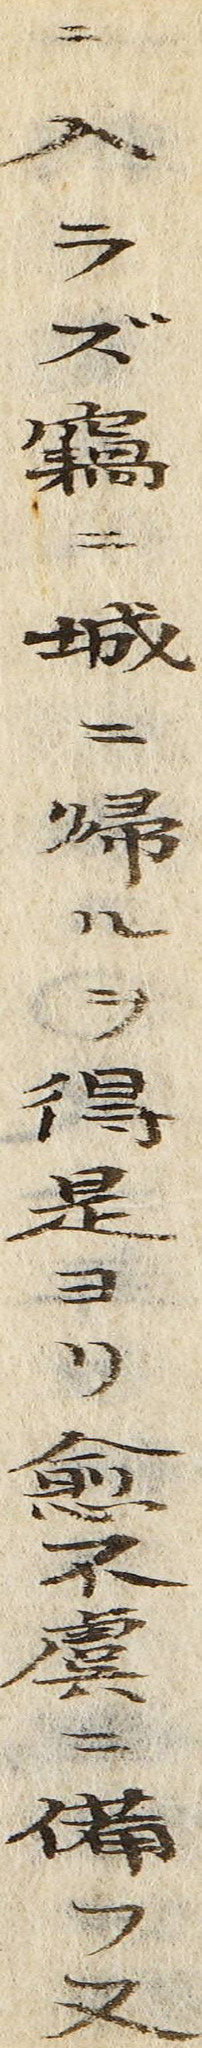ニ入ラズ竊ニ城ニ帰ルヲ得是ヨリ愈不虞ニ備フ又
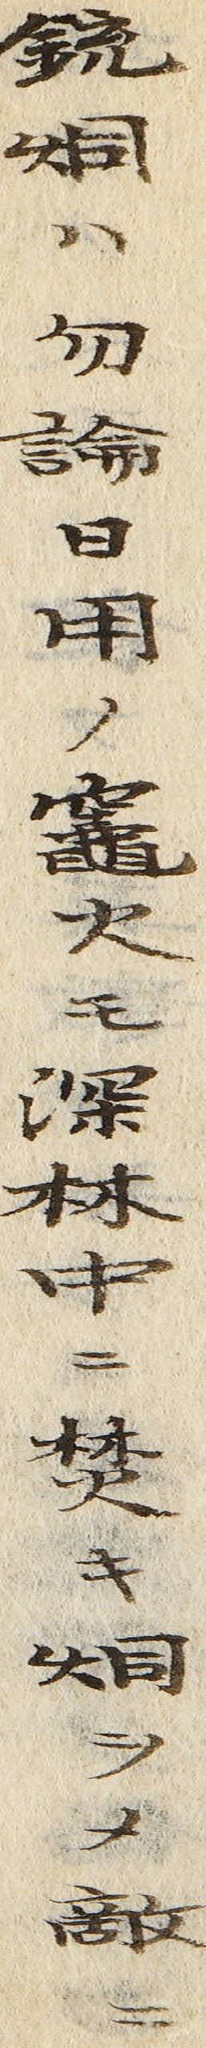銃煙ハ勿論日用ノ竈火モ深林中ニ焚キ煙ヲシテ敵ニ
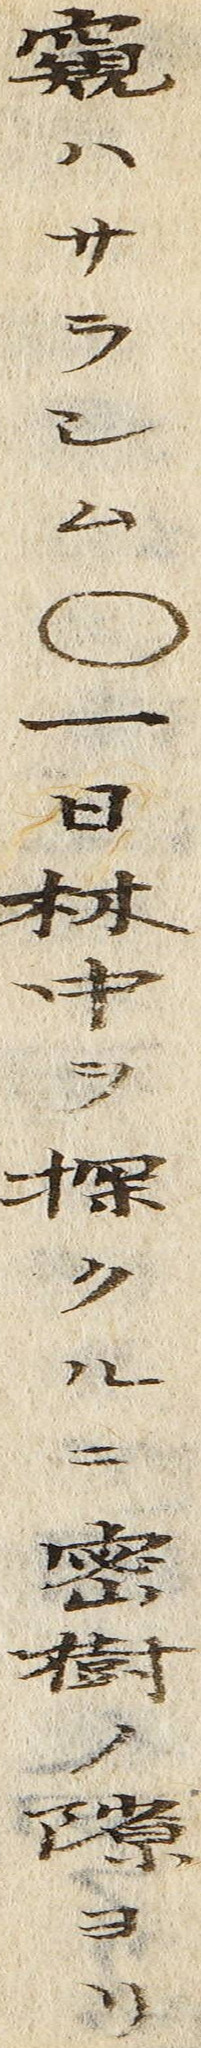窺ハサラシム◯一日林中ヲ探クルニ密樹ノ隙ヨリ
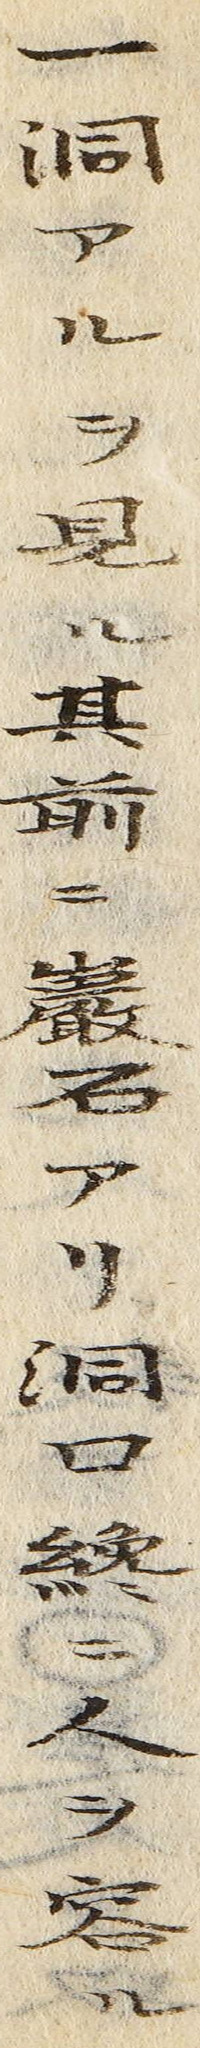一洞アルヲ見ル其前ニ巌石アリ洞口纔ニ人ヲ容ル
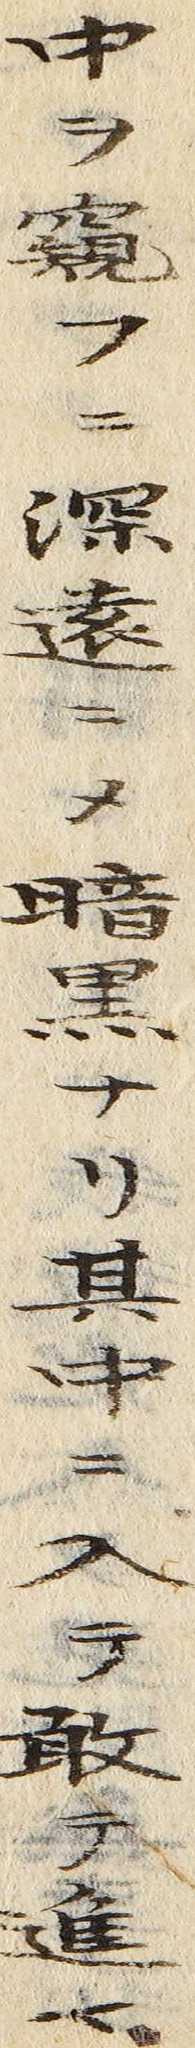中ヲ窺フニ深遠ニシテ暗黒ナリ其中ニ入テ敢テ進マ
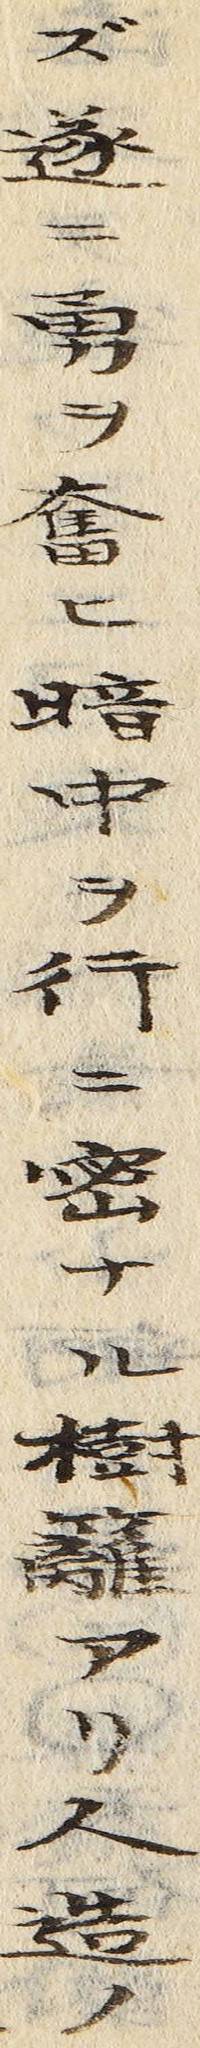ズ遂ニ勇ヲ奮ヒ暗中ヲ行ニ密ナル樹籬アリ人造ノ
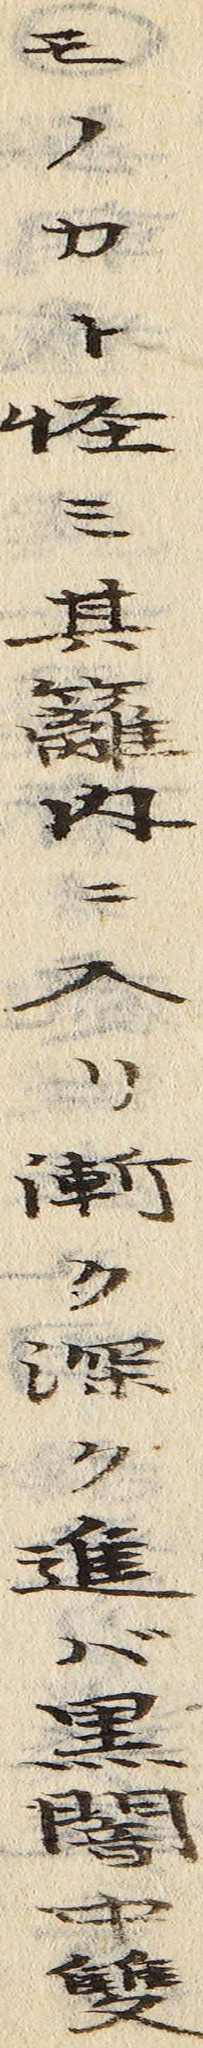モノカト怪ミ其籬内ニ入リ漸ク深ク進バ黒闇中双
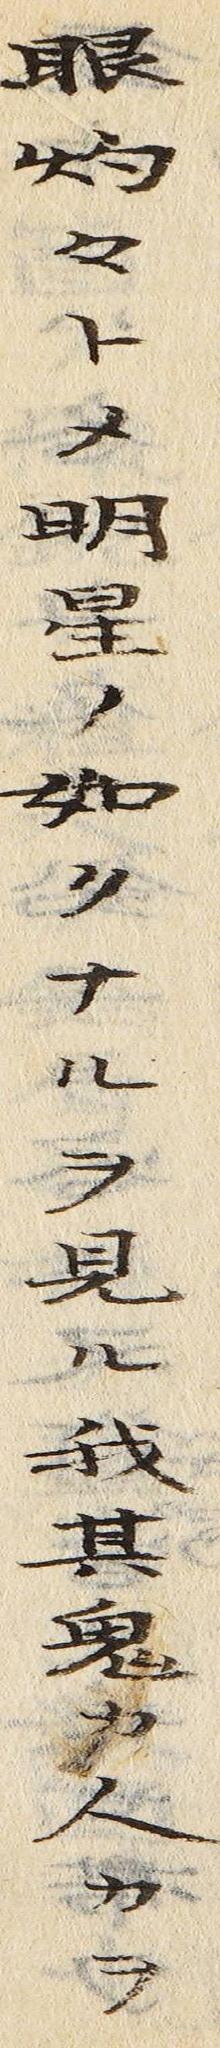眼灼々トシテ明星ノ如クナルヲ見ル我其鬼カ人カヲ
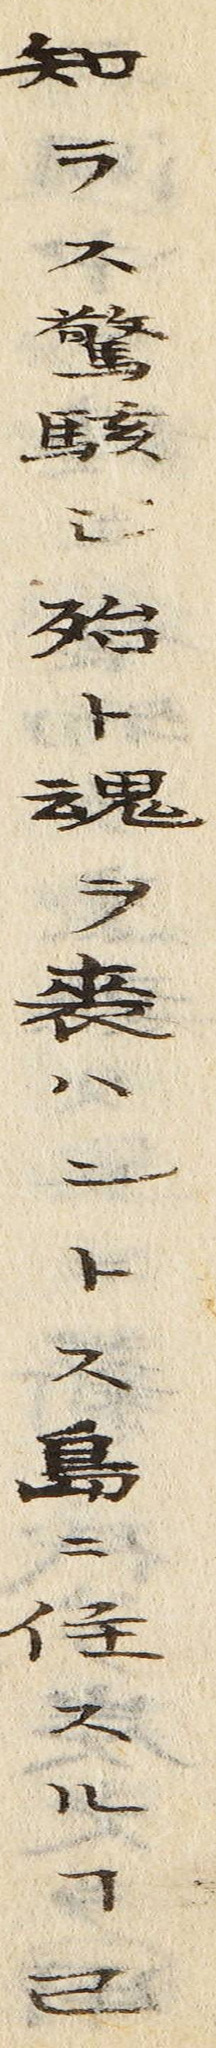知ラス驚駭シ殆ト魂ヲ喪ハントス島ニ住スルコト已
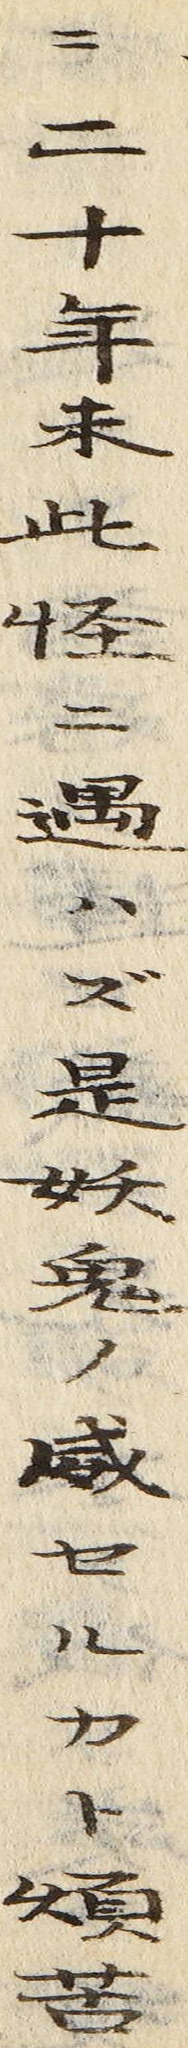ニ二十年未此怪ニ遇ハズ是妖鬼ノ威セルカト煩苦
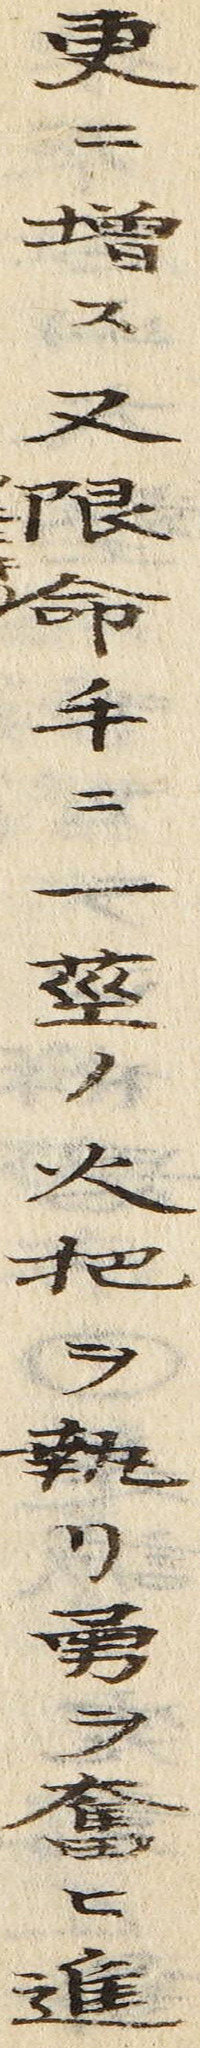更ニ増ス又限命手ニ一茎ノ火把ヲ執リ勇ヲ奮ヒ進
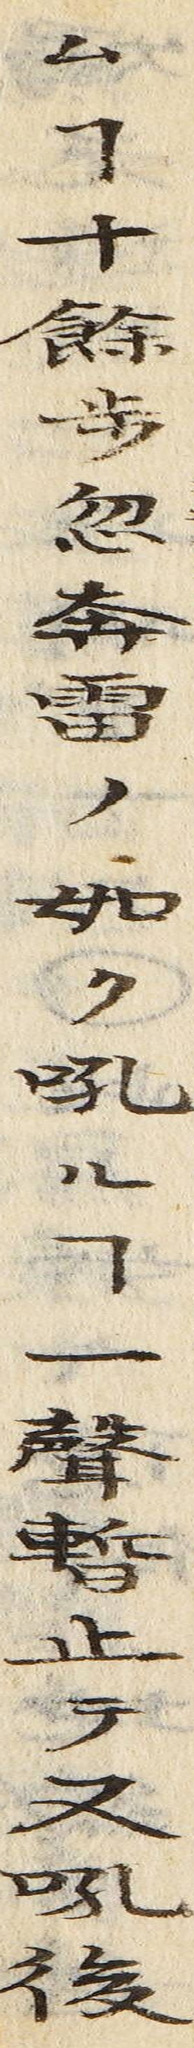ムコト十余歩忽奔雷ノ如ク吼ルコト一声暫止テ又吼後
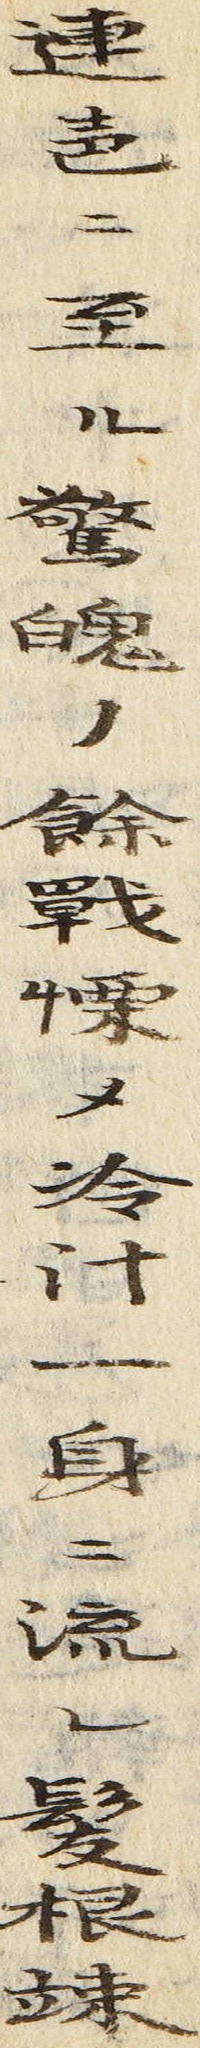連声ニ至ル驚魄ノ余戦慄シテ冷汁一身ニ流レ髪根竦
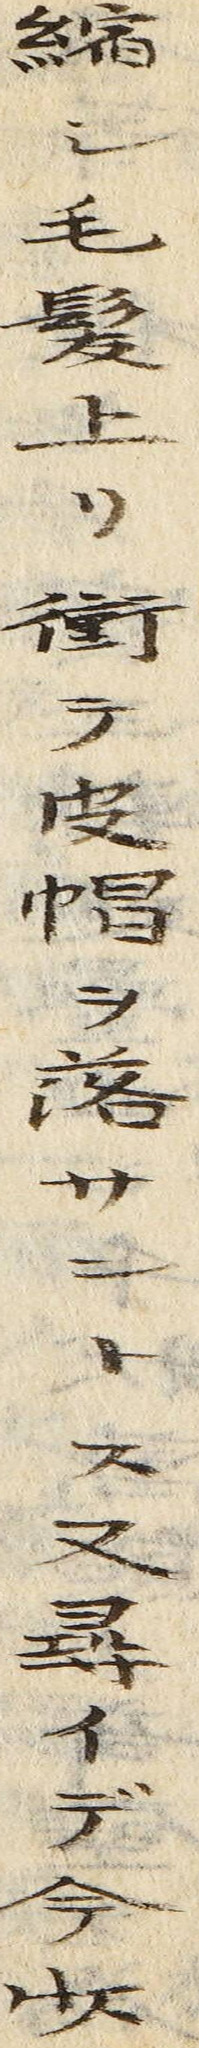縮シ毛髪上リ衝テ皮帽ヲ落サントス又尋イデ今少
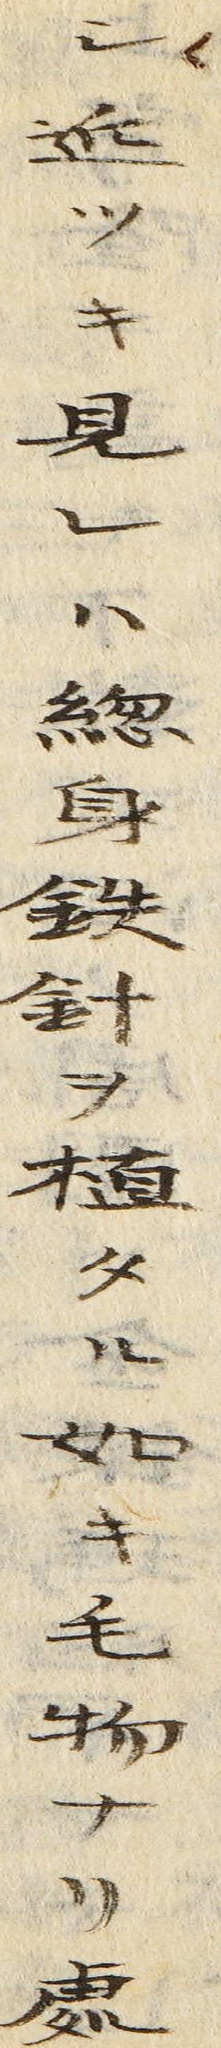シ近ツキ見レハ総身鉄針ヲ植タル如キ毛物ナリ処
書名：漂流紀事
